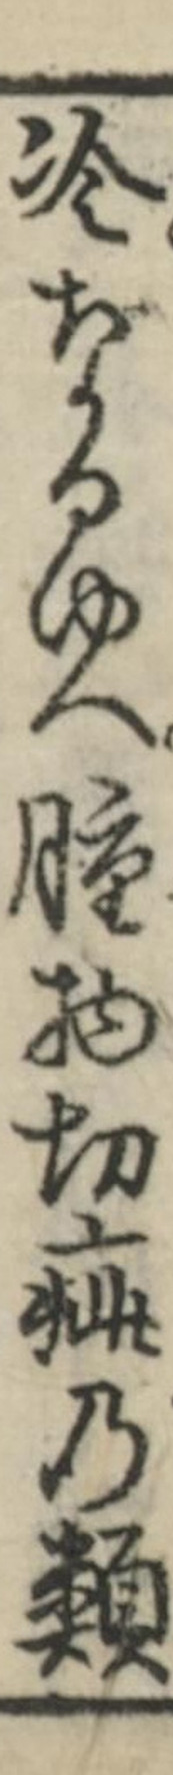冷なるゆへ。腫物切疵の類。
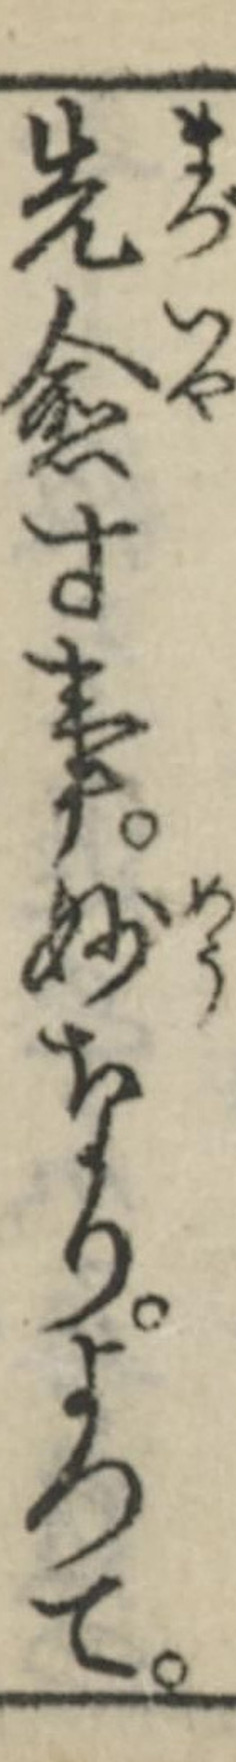先癒す事。妙なり。よつて。
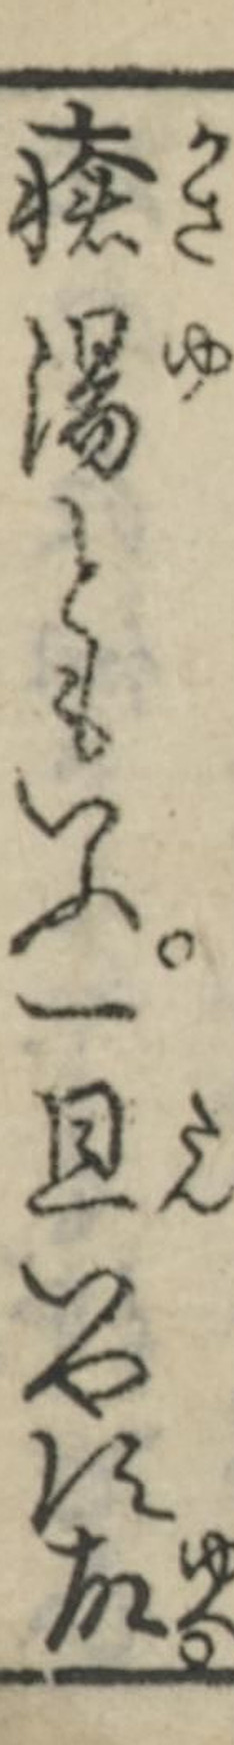瘡湯ともいふ。一旦いやす故。

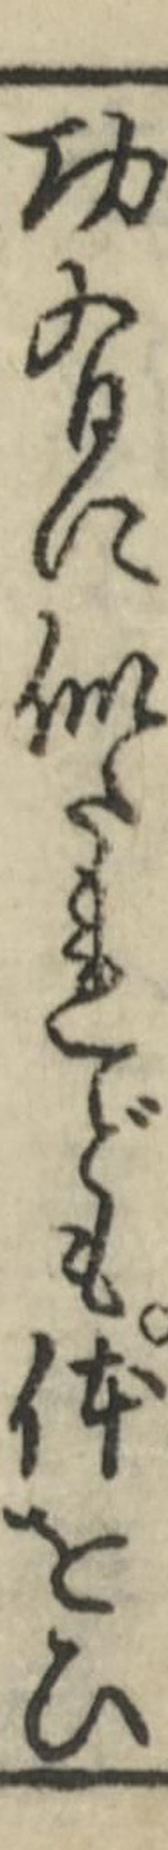功有に似たれども。体をひ
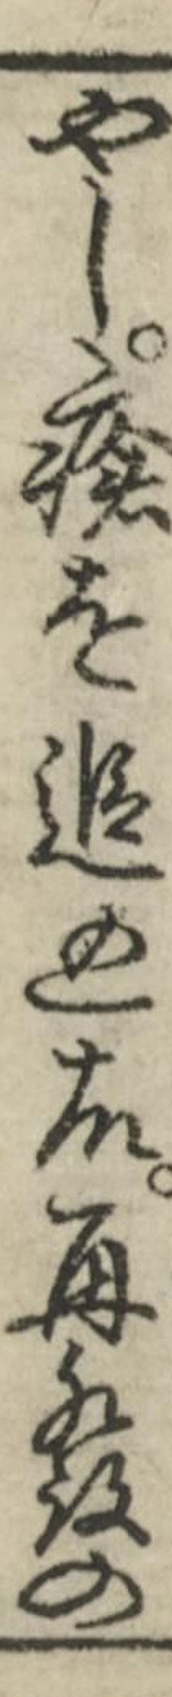やし。瘡を追込故。再発の
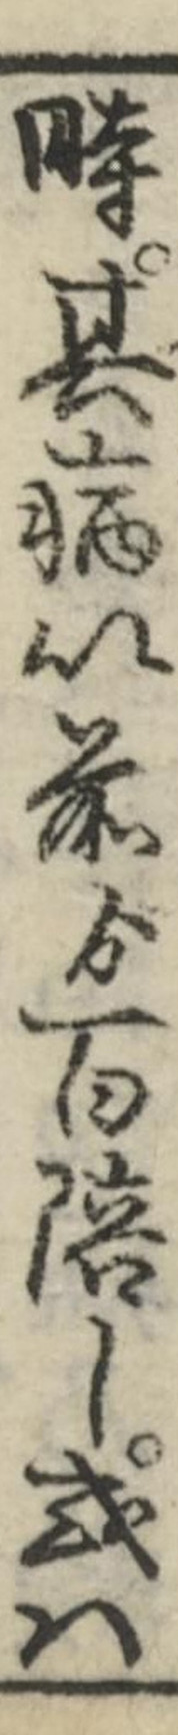時。其病以前ゟ百倍し。或は
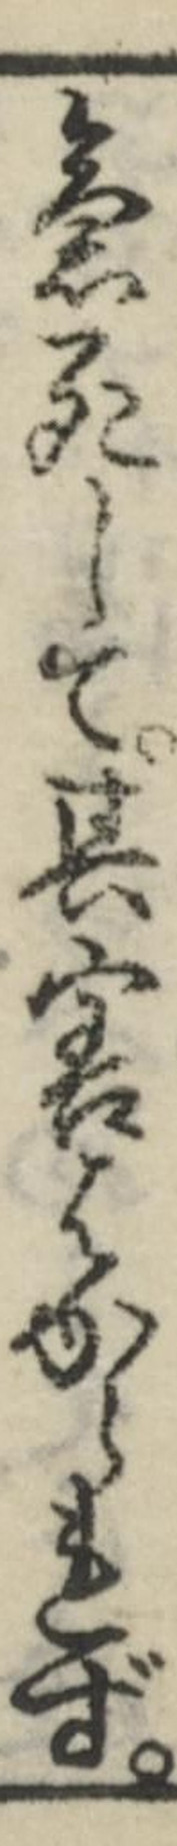急死して。其害はかられず。
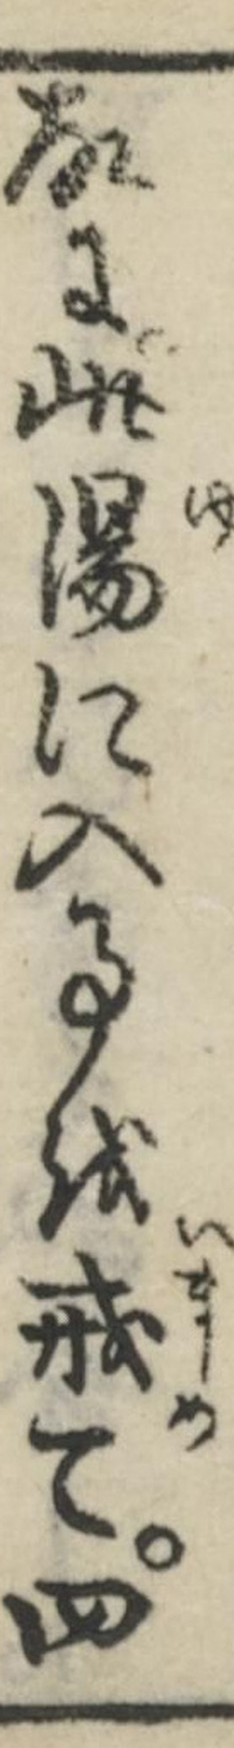故に。此湯に入るを戒て。四
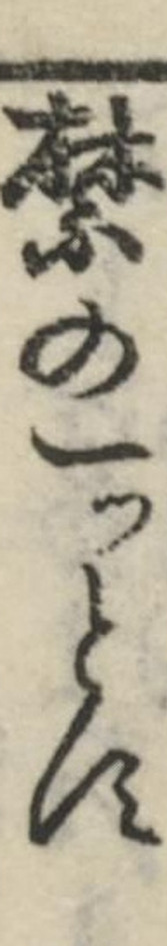禁の一ッとす
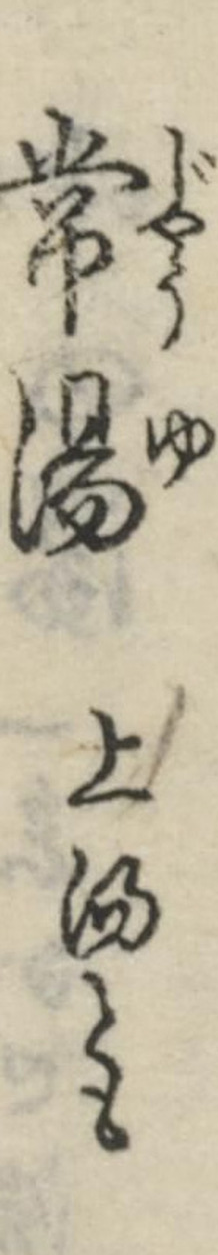常湯上湯とも
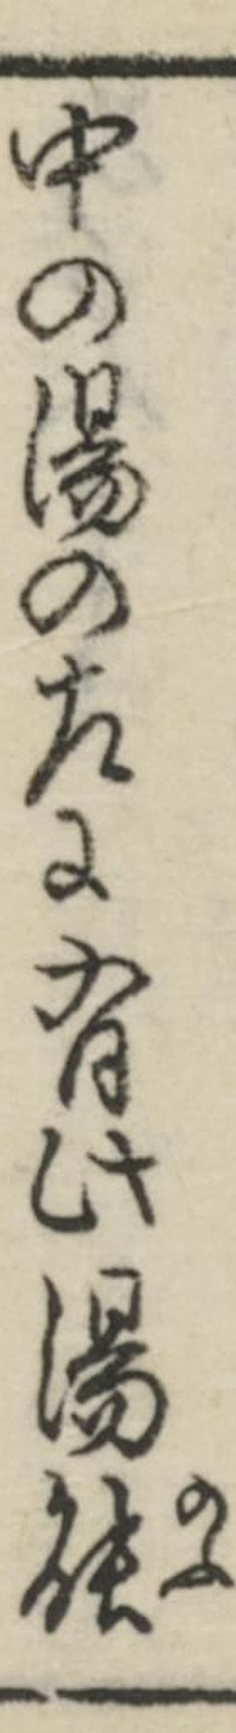中の湯の左に有此湯能
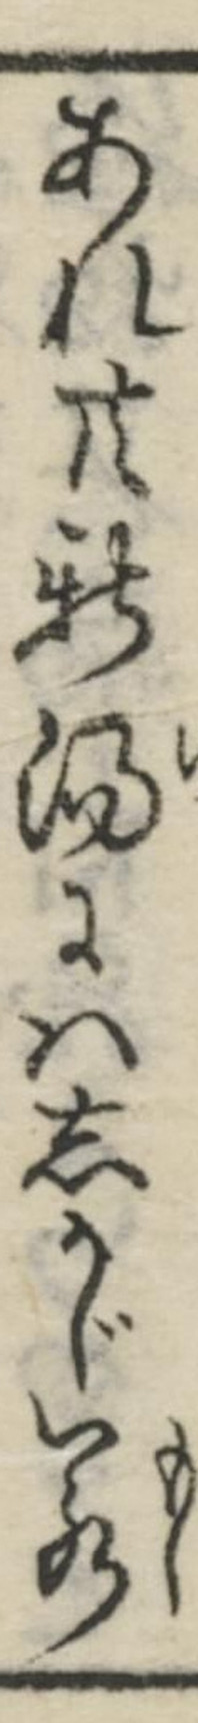あれ共新湯にはしかじ若
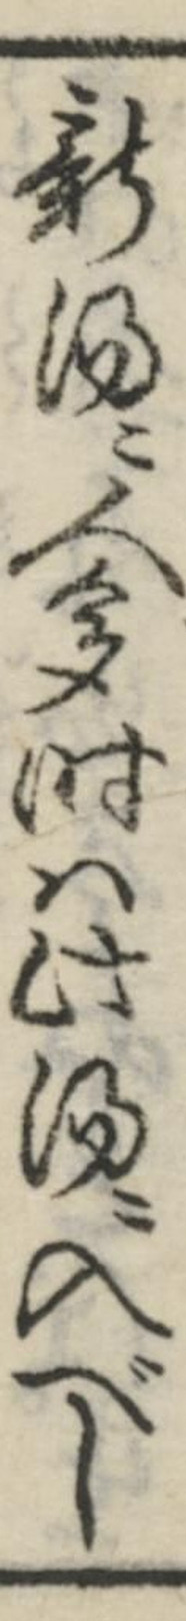新湯に人多時は此湯に入べし
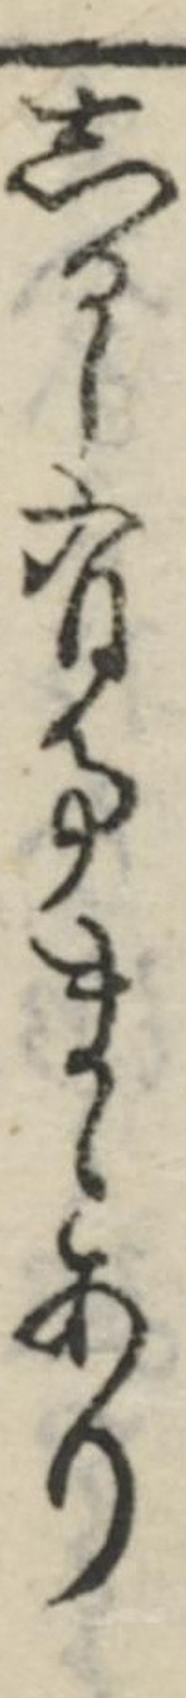しるし有事ままあり
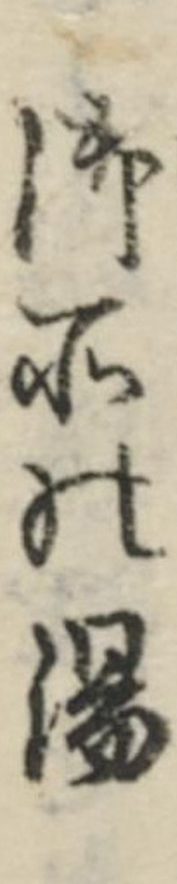御所の湯
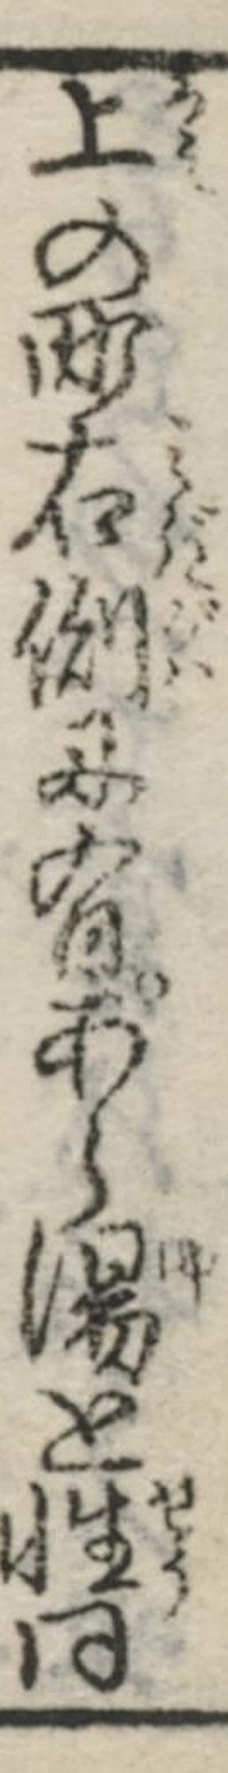上の町右側に有。あら湯と性同
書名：但州城崎浴湯辧
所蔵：東京大学地震研究所図書室 Earthquake Research Institute Library, The University of Tokyo, JAPAN
